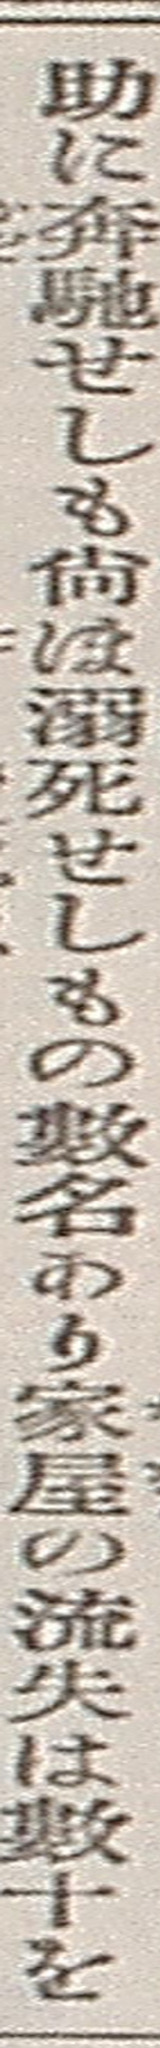助に奔馳せしも尚ほ溺死せしもの数名あり家屋の流失は数十を
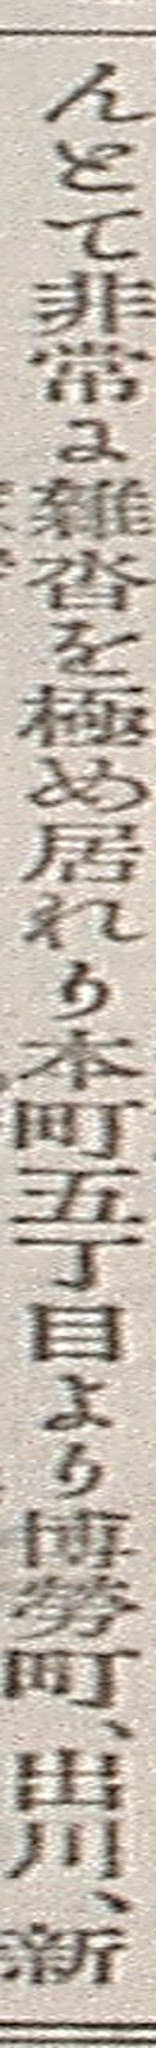んとて非常に雑沓を極め居れり本町五丁目より博労町、出川、新
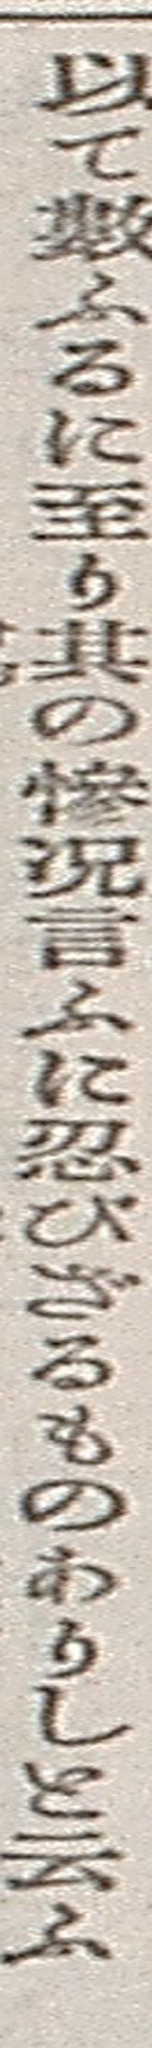以て数ふるに至り其の惨況言ふに忍びざるものありしと云ふ
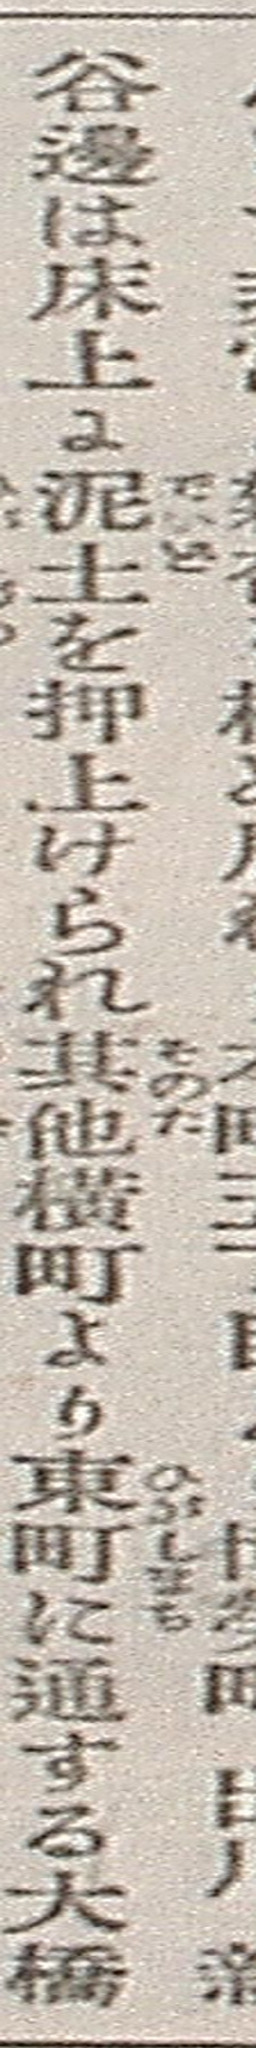谷辺は床上に泥土を押上けられ其他横町より東町に通する大橋
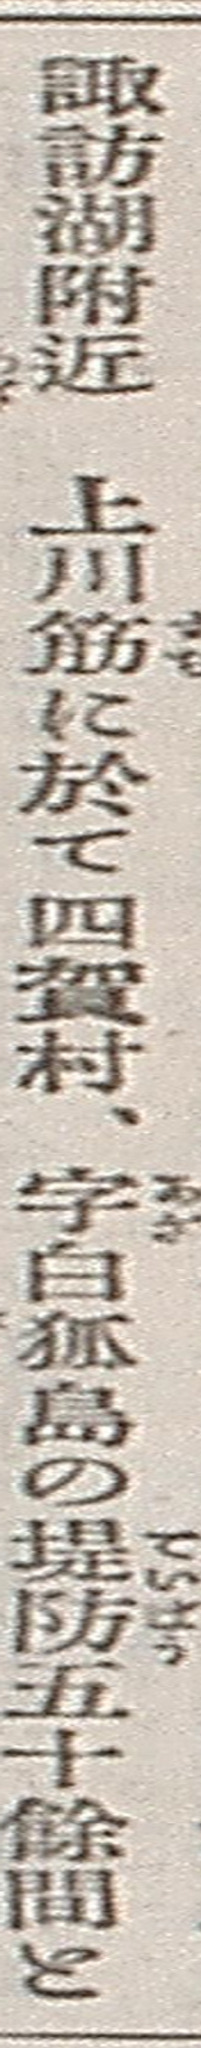諏訪湖附近上川筋に於て四賀村、字白狐島の堤防五十餘間と
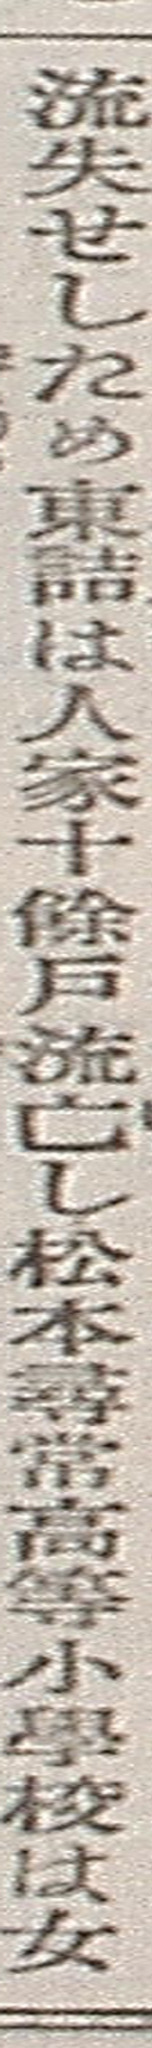流失せしため東詰は人家十餘戸流亡し松本尋常高等小学校は女
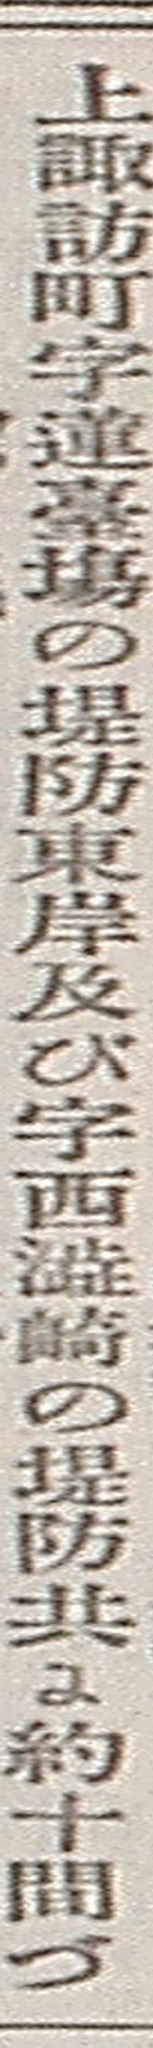上諏訪町字蓮台場の堤防東岸及び字西渋崎の堤防共に役十間づ
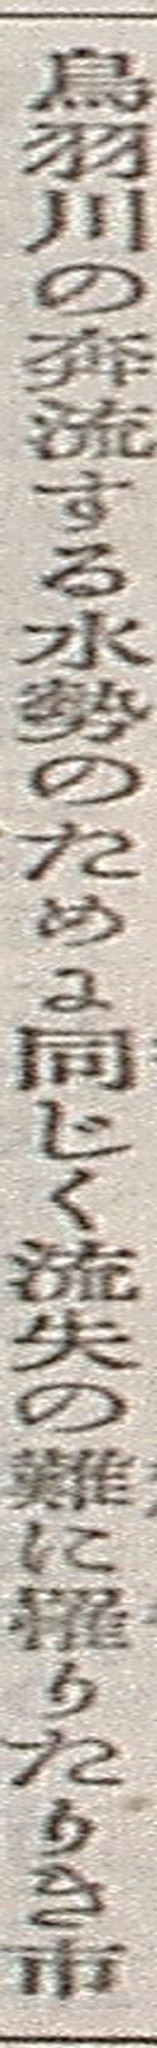鳥羽川の奔流する水勢のために同じく流失の難に罹りたりき市
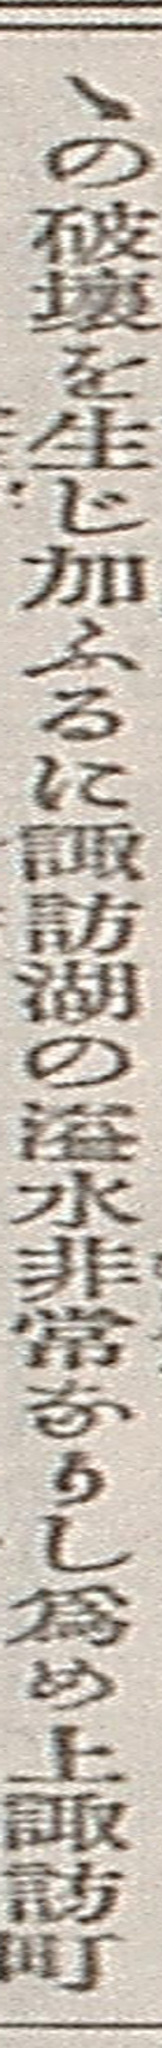ゝの破壊を生じ加ふるに諏訪湖の溢水非常なりし為め上諏訪町
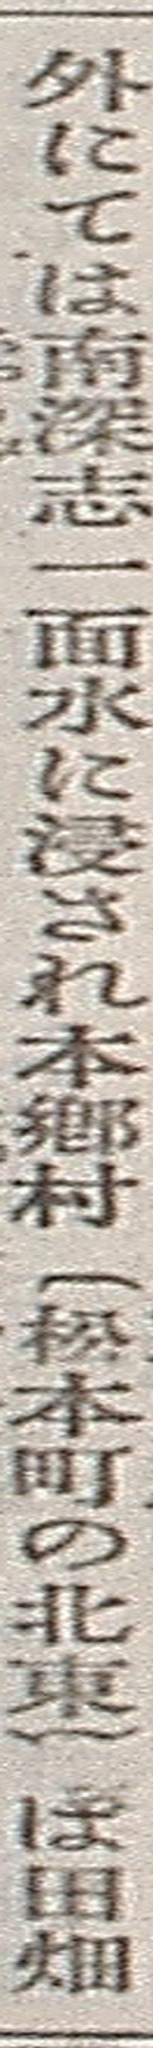外にては南深志一面水に侵され本郷町の北東）は田畑
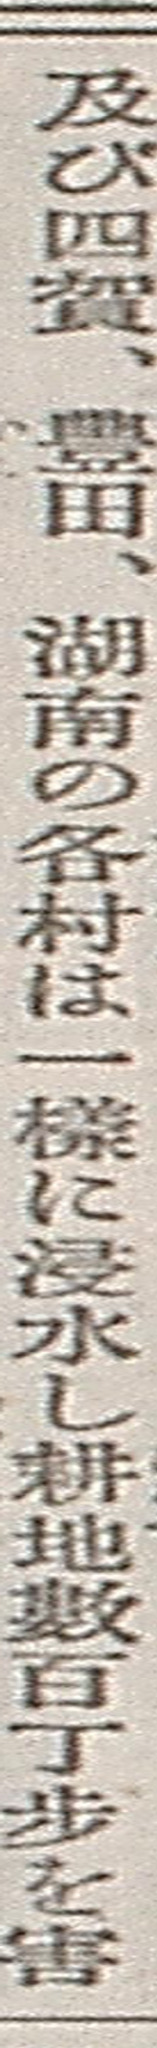及び四賀、豊田、湖南の各村は一様に浸水し耕地数百丁歩を害
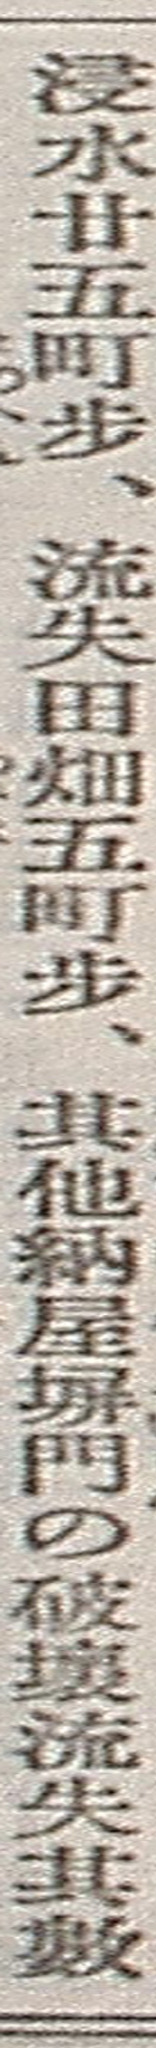浸水廿五町歩、流失田畑五町歩、其他納屋塀門の破壊流失其数
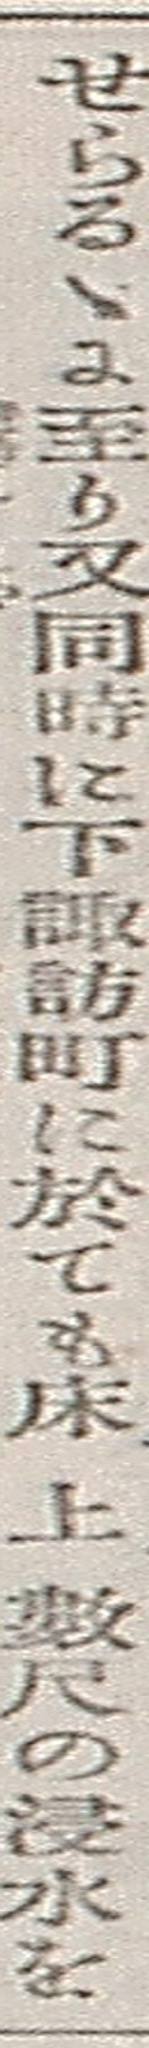せらるゝに至り又同時に下諏訪町に於ても床上数尺の浸水を
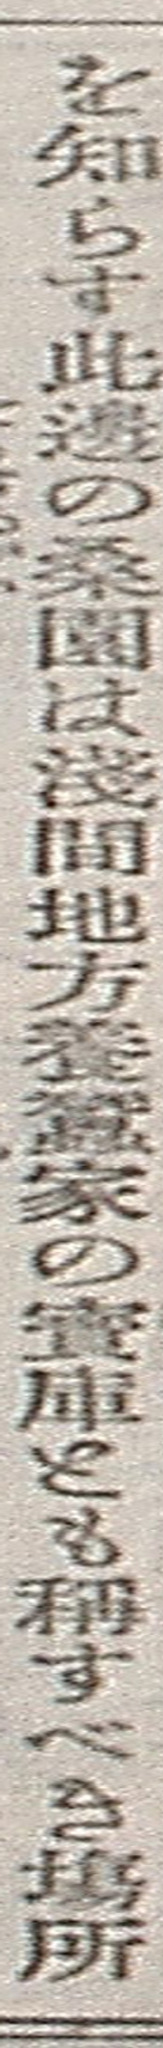を知らず此邊の桑園は浅間地方養蚕家の宝庫とも称すべき場所
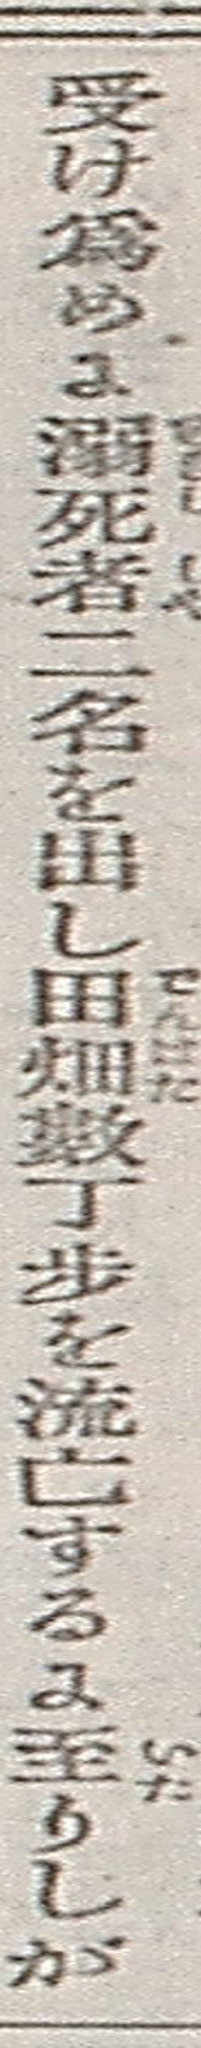受け為めに溺死者二名を出し田畑数丁歩を流亡するに至りしが
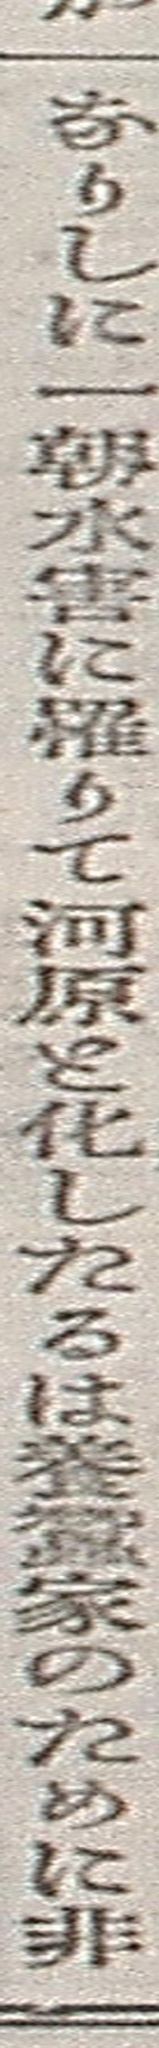なりしに一朝水害に罹りて河原と化したるは養蚕家のために非
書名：風俗畫報臨時増刊第百二十六號　洪水被害録（中）
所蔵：東京大学地震研究所図書室 Earthquake Research Institute Library, The University of Tokyo, JAPAN
